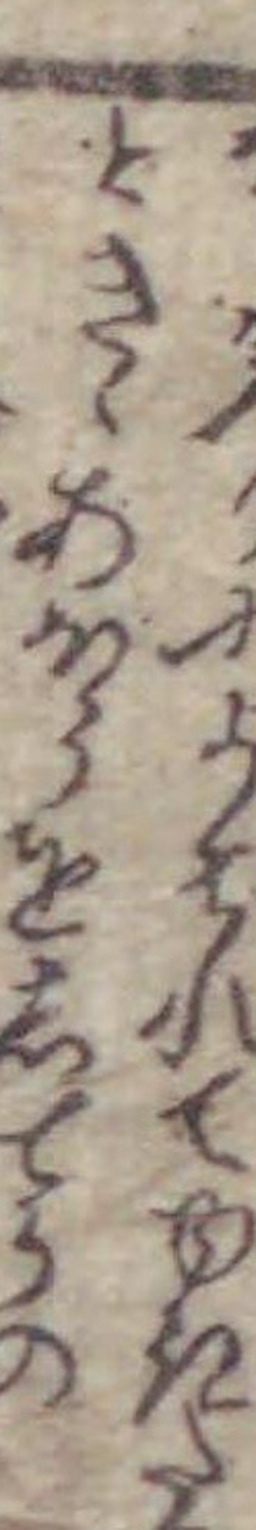ときゝあほうをしてうの
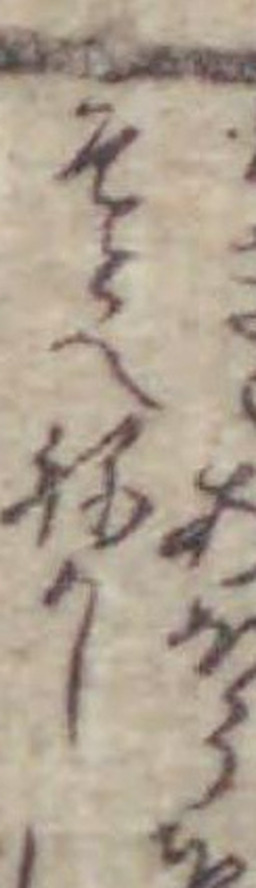そとへねかし
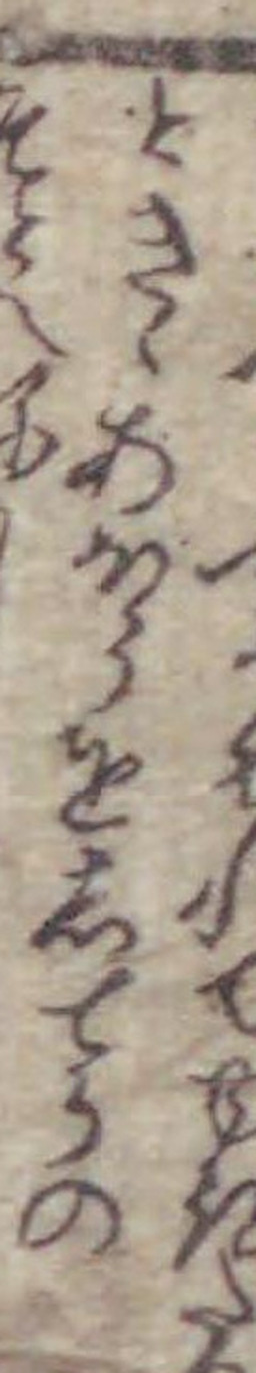ときゝあほうをしてうの
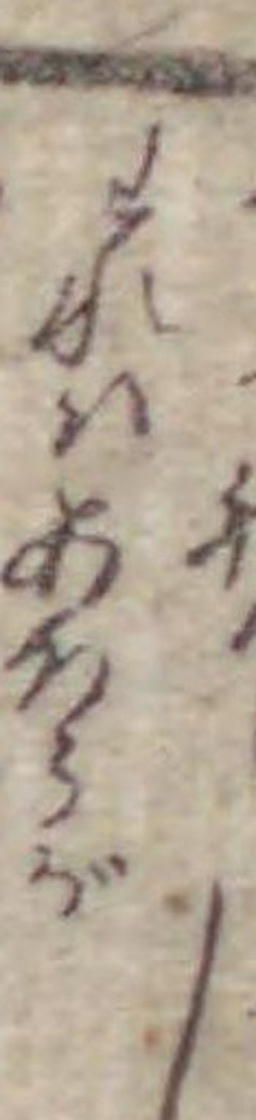たれはあほうが
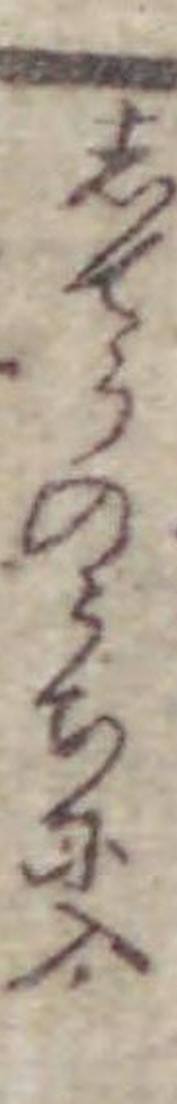してうのうちに入
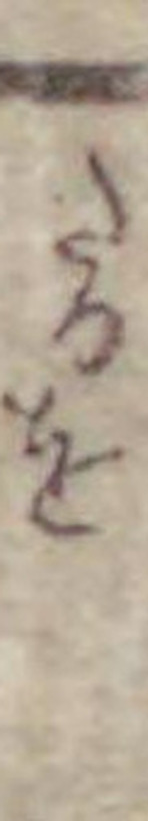たるを
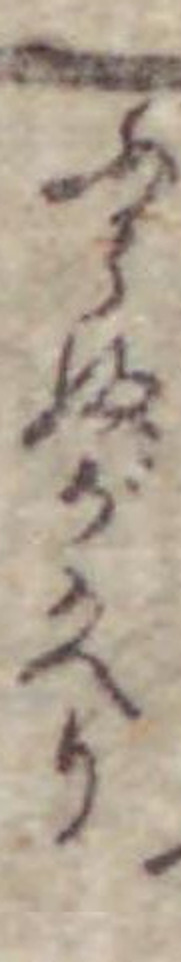ふうふがかへり
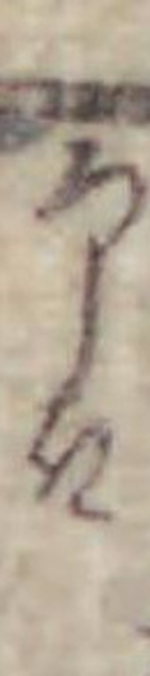ろしき
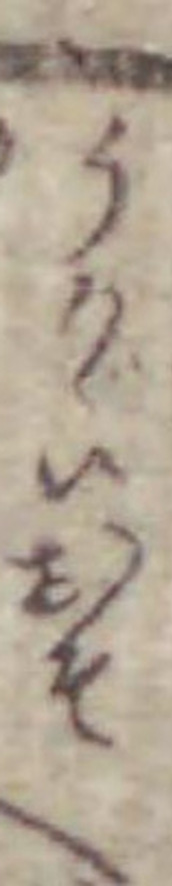うかゞいおそ
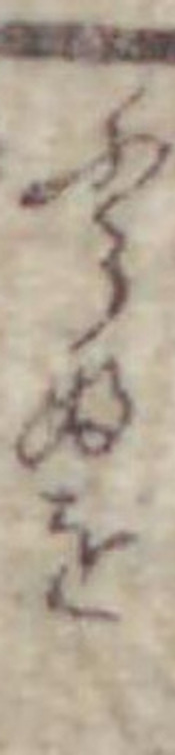ふうふを
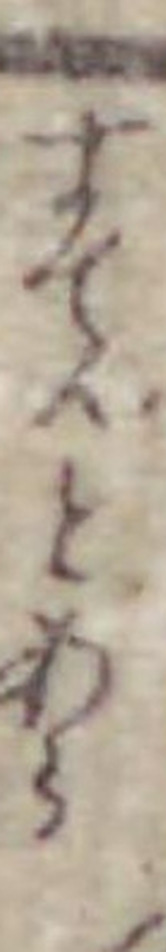すてんとあら
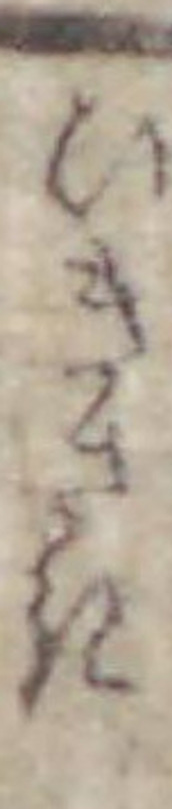ひきさき
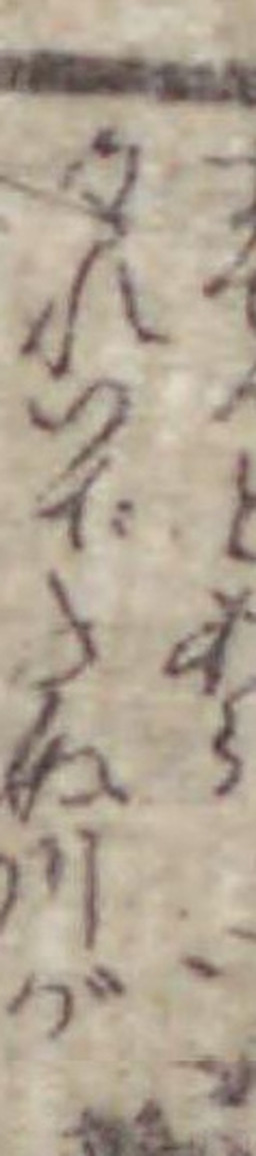われいできぬ川が
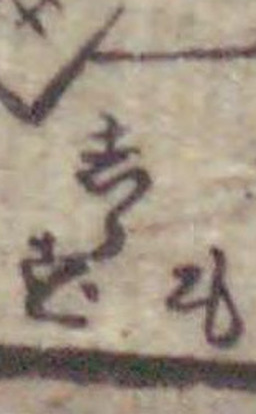しらず
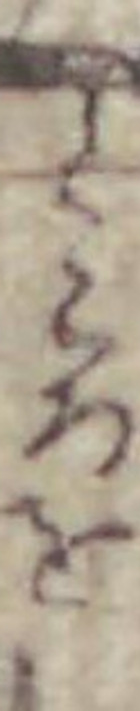ところを
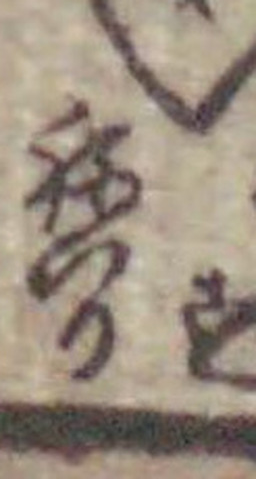ねいり
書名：嗚呼不侭世之助噺 : 3巻
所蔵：国立国会図書館 National Diet Library, JAPAN
